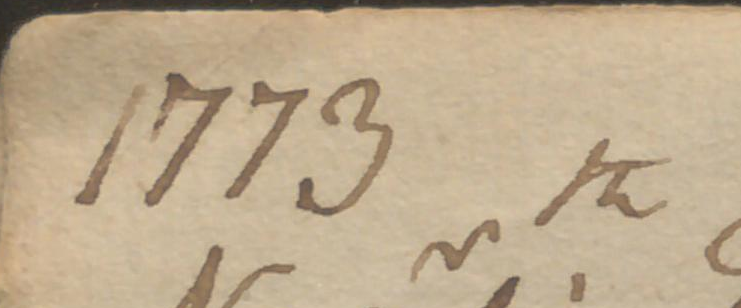1773
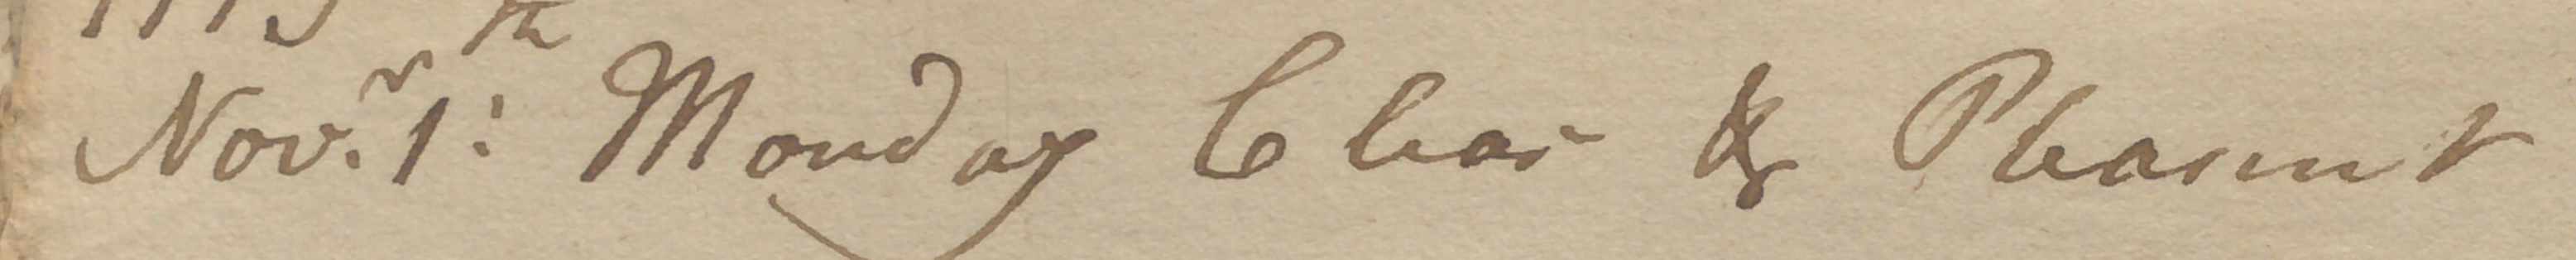Nov^r. 1^th. Monday Clear & Pleasent
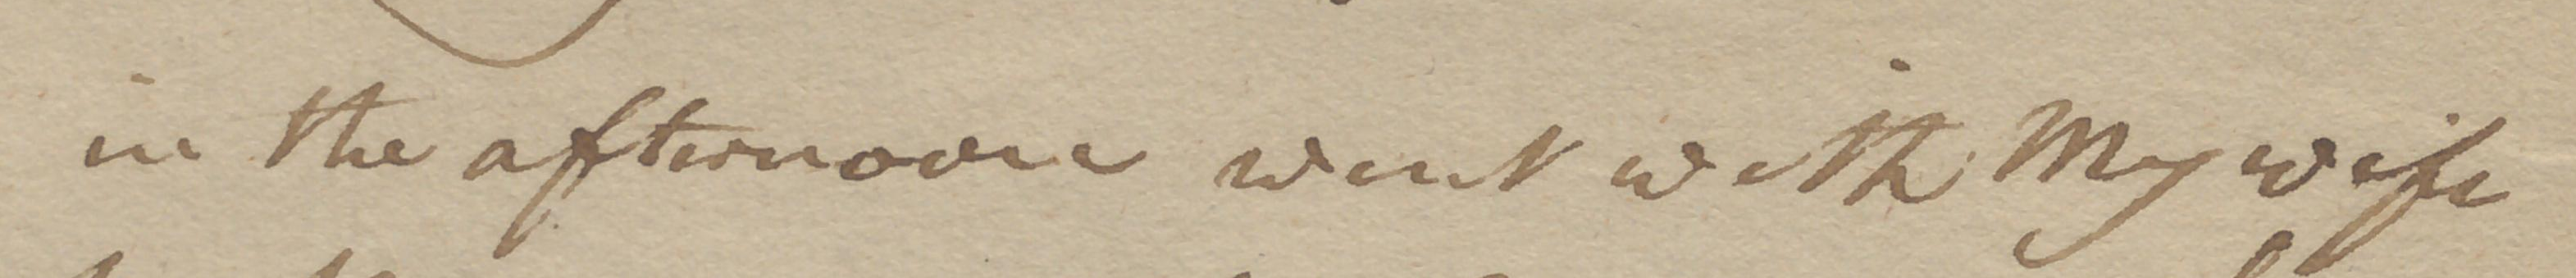in the afternoon went with My wife
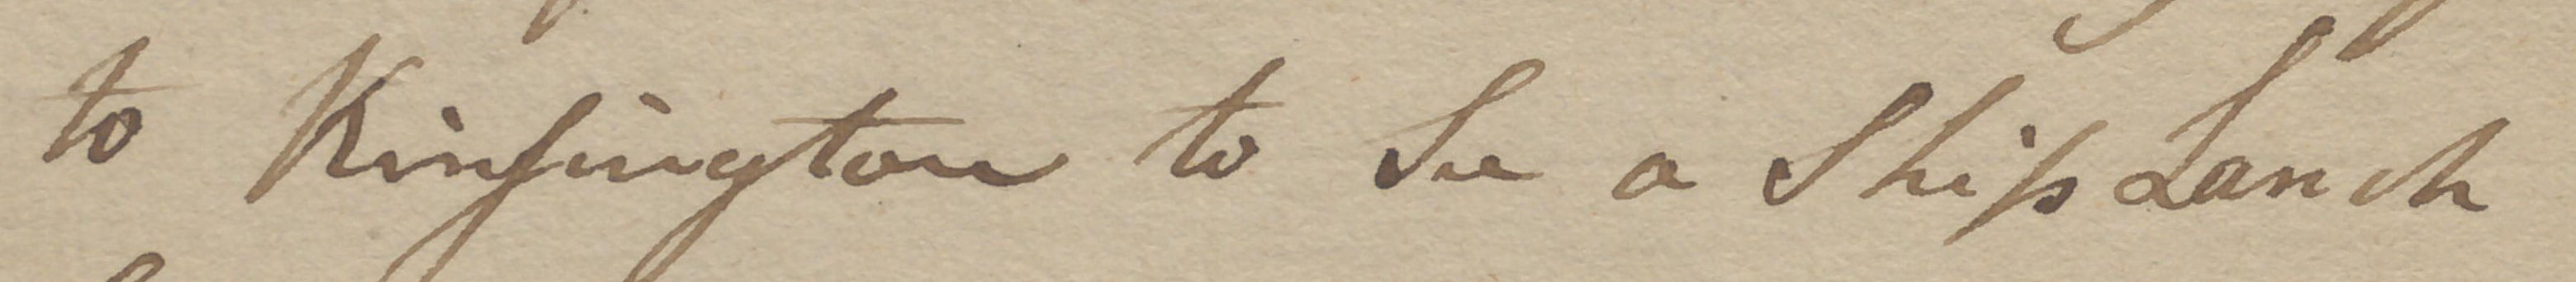to Kinsington to see a Ship Lanch
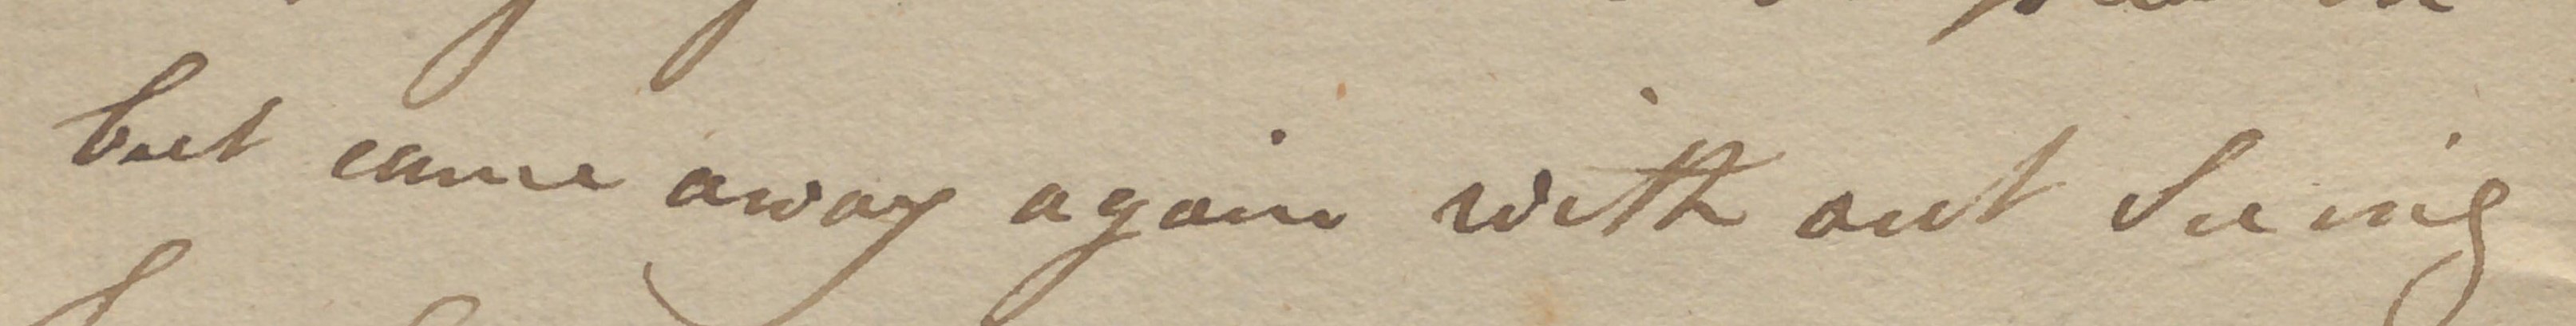but came away again with out seeing
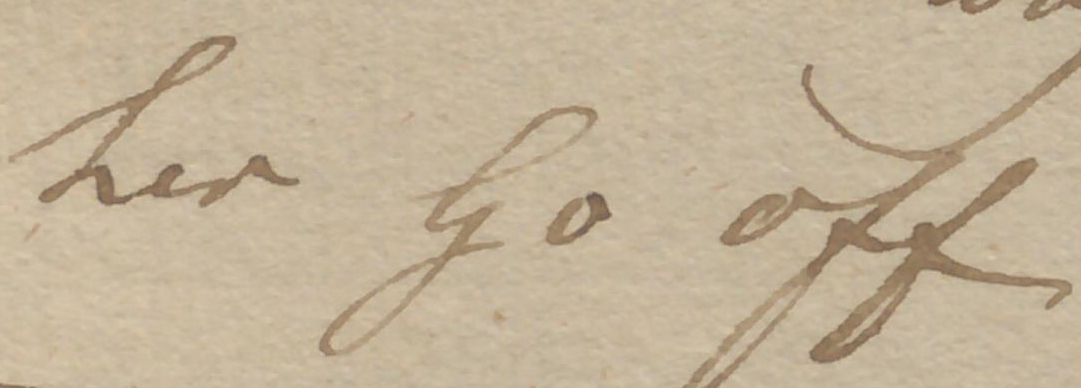her Go off
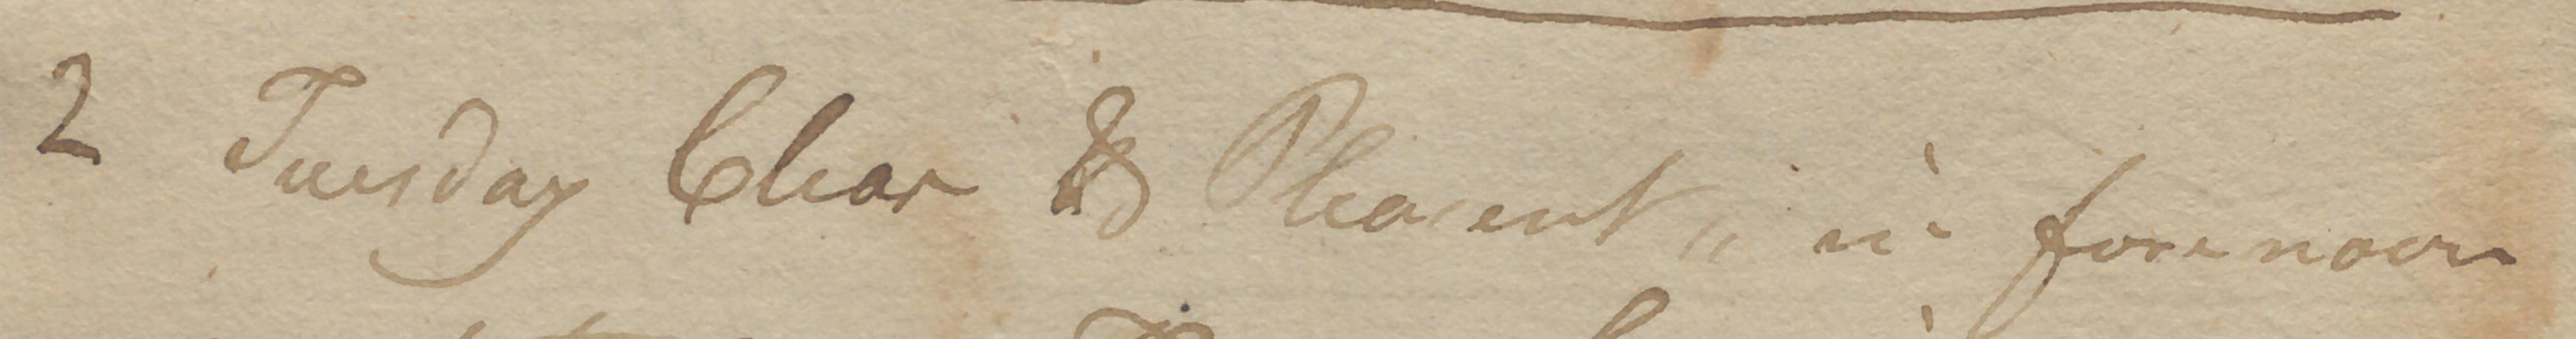2 Tuesday Clear Pleasent, in forenoon
